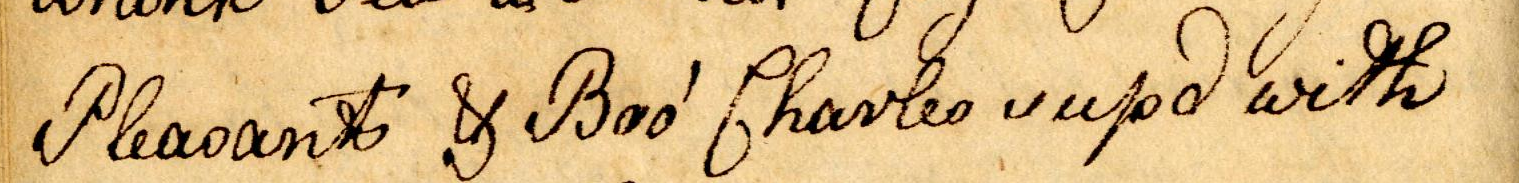Pleasants & Bro' Charles supd with
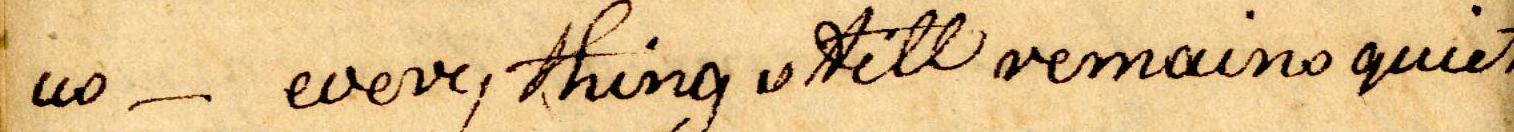us- everything still remains quiet
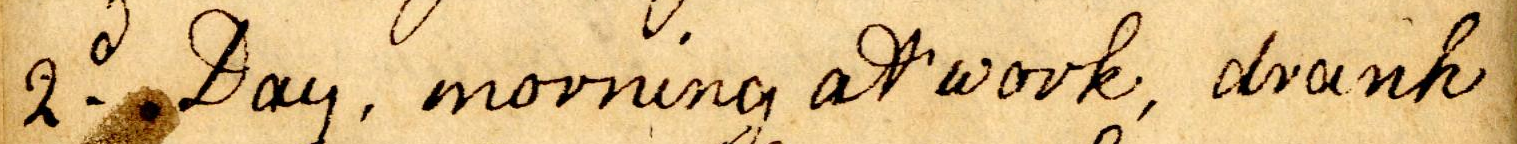2^d. Day. morning at work, drank
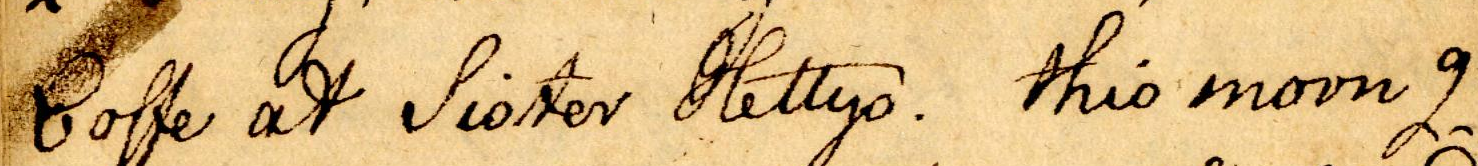Coffe at Sister Hettys. this morn^g
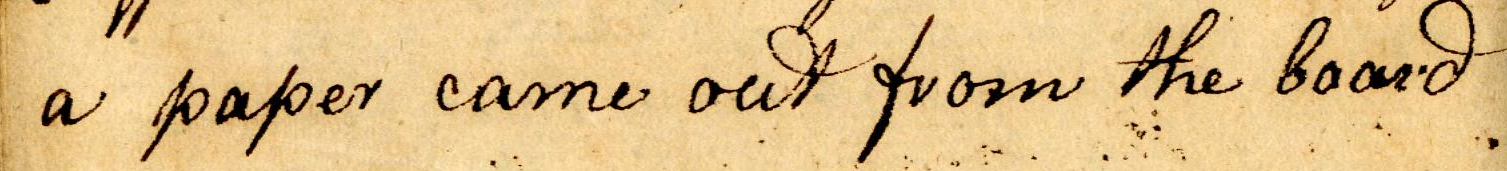a paper came out from the board
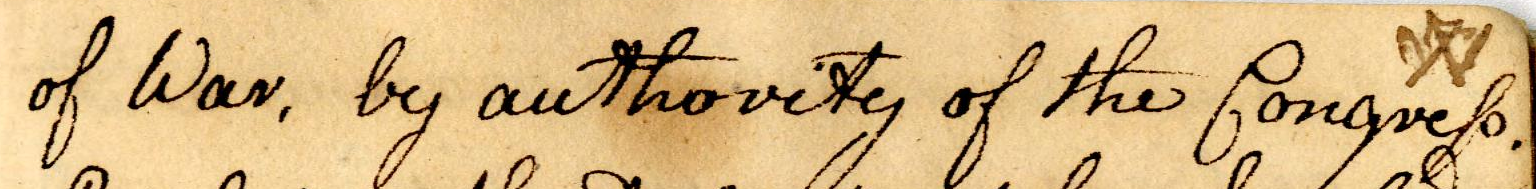of War, by authority of the Congress
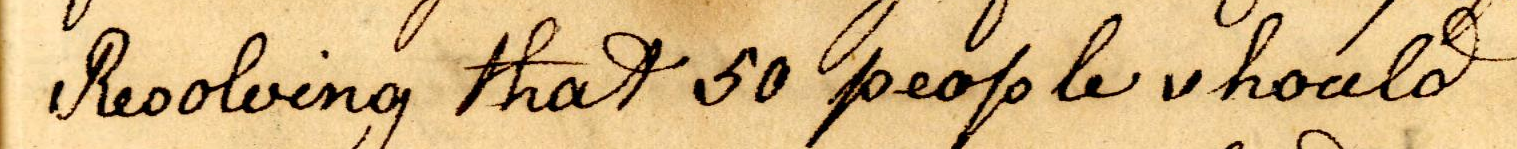Resolving that 50 people should
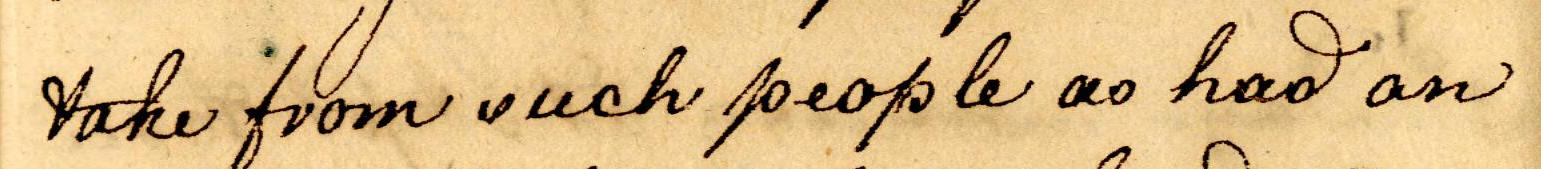take from such people as had an
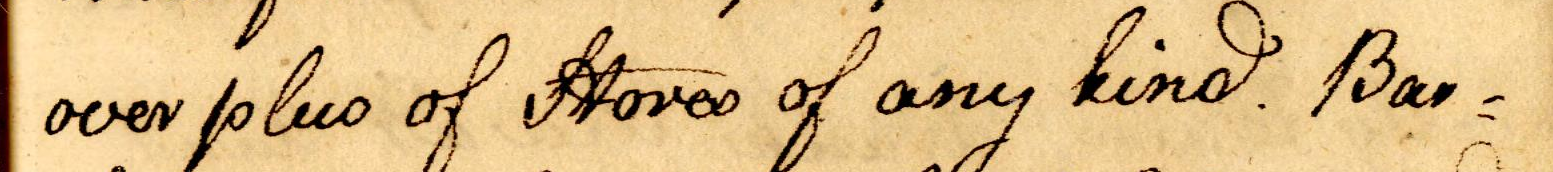over plus of Stores of any kind. Bar-
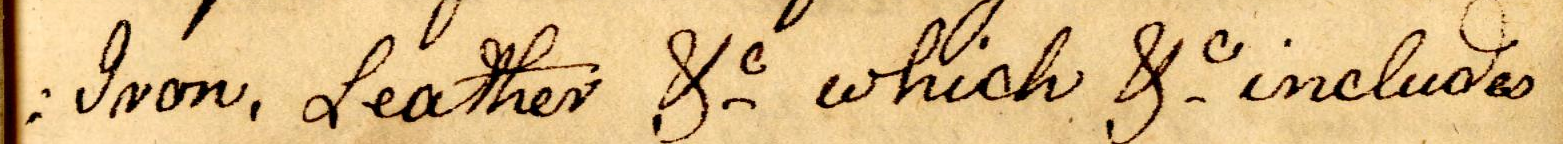-Iron, Leather &^c which &^c includes
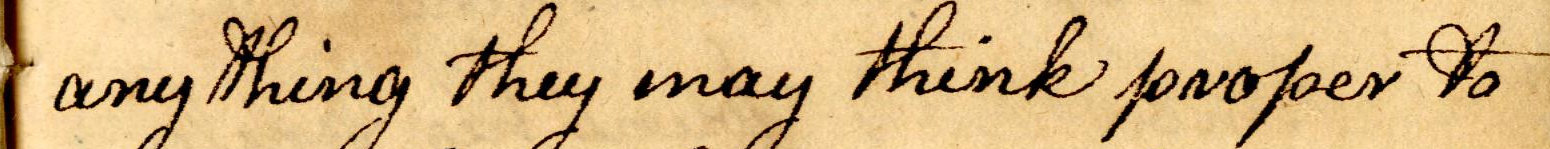anything they may think proper to
